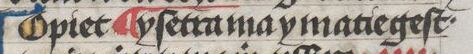Opiet yſeſtra ma y matie geſt.
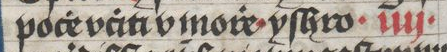poċe vċiti o moṙe.y ſhro. iiij.
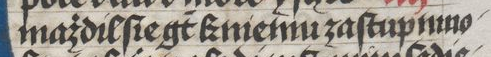mażdil ſie ḡt k níemu zaſtup mno¬
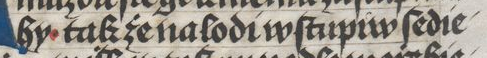hy tak że na lodi wſtupiw ſedíe
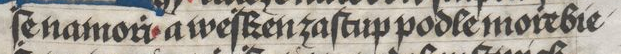ẛe na moṙi.a weẛken zaſtup podle moṙe bíe¬
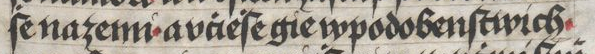ẛe nazemi.a vċieẛe gie wpodobenſtwích.
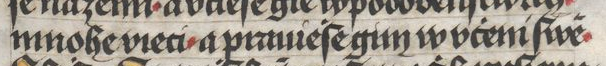mnohe vieci.a prauieẛe gim w vċeni ſwē.
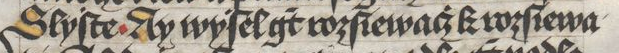Slyẛte.Ay wyẛel ḡt rozſiewacż k rozſiewa¬
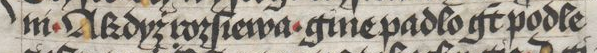ní.A kdyż rozſiewa.gine padlo ḡt podle
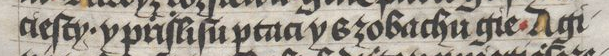cieſty.y pṙiẛliſu ptaci y szobachu gie.A gi¬
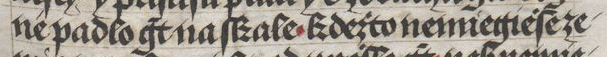le padlo ḡt na ſkale.kdeżto nemiegieẛe ze¬
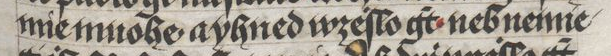mie mnohe.a yhned wzeẛlo ḡt neb nemie¬
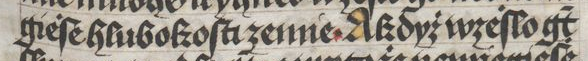gíeẛe hlubokoſti zemie.A kdyż wzeẛlo ḡt
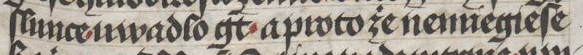ſlunce.uwadlo ḡt.a proto że nemiegíeẛe
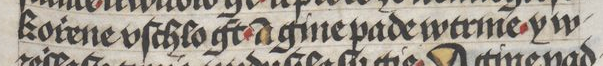koṙene uſchlo ḡt A gine pade wtrnie y w¬
